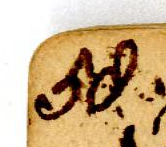58
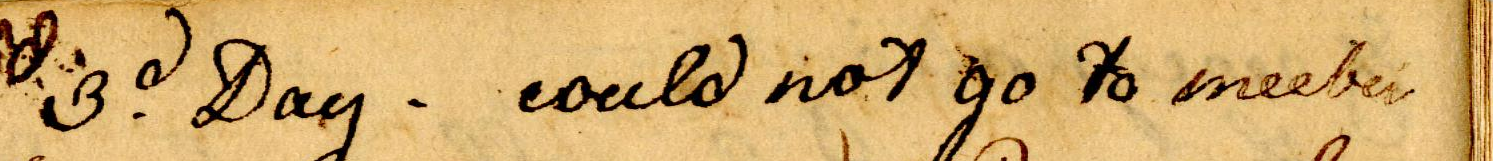3^d Day. could not go to meetin
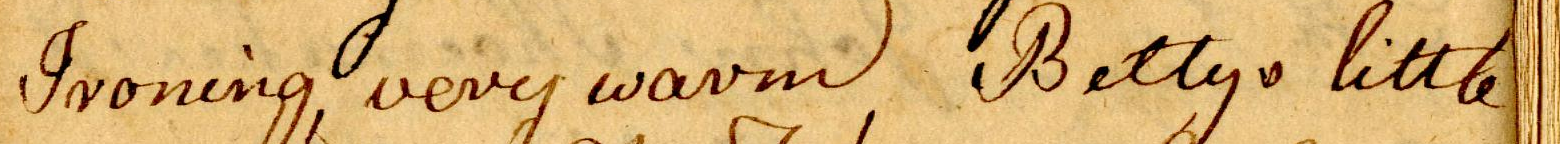Ironing, very warm Bettys little
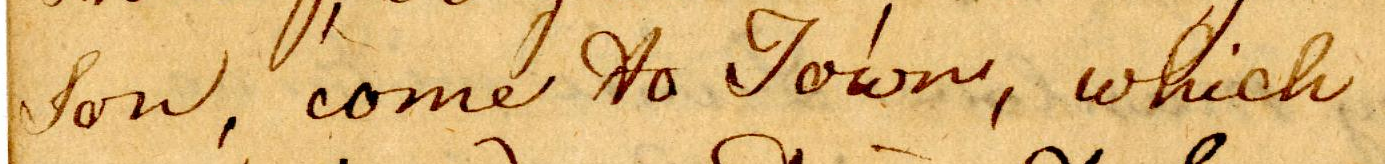Son, come to Town, which
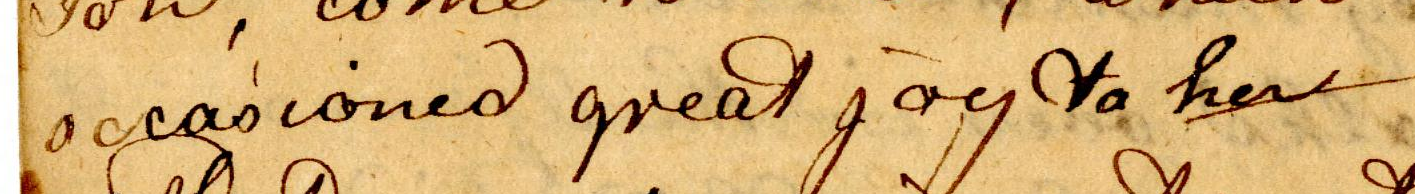occasioned great joy to her
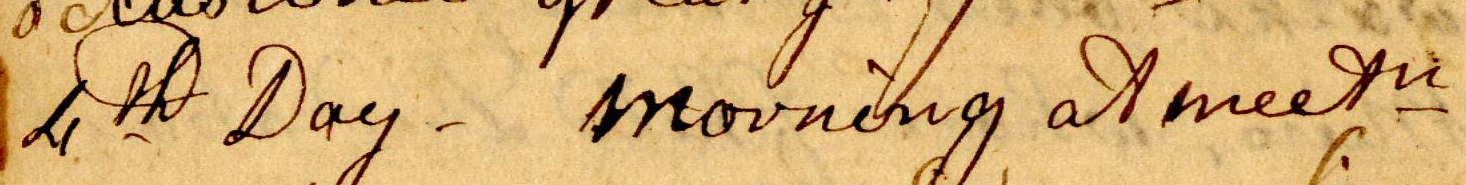4^th Day- Morning at meet^n
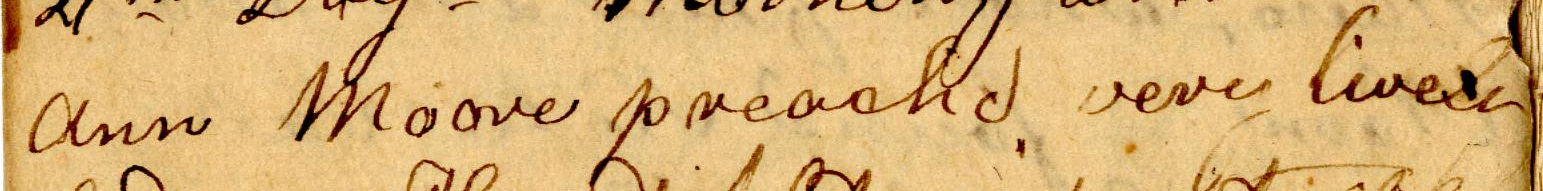Ann Moore preachd very lively
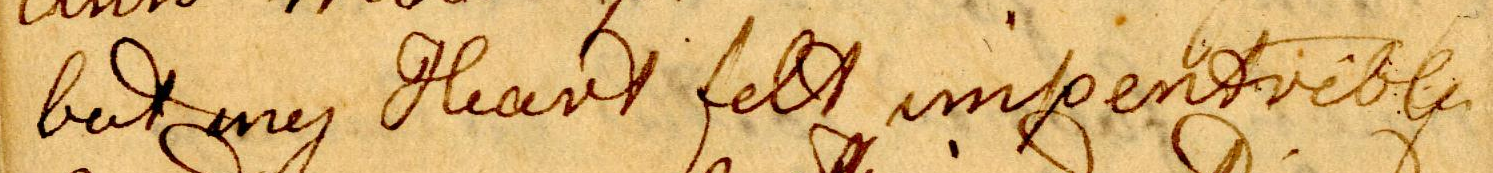but my Heart felt impentrible
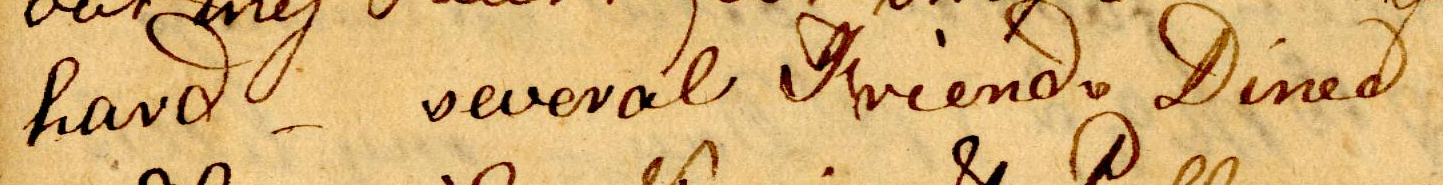hard- several Friends Dined
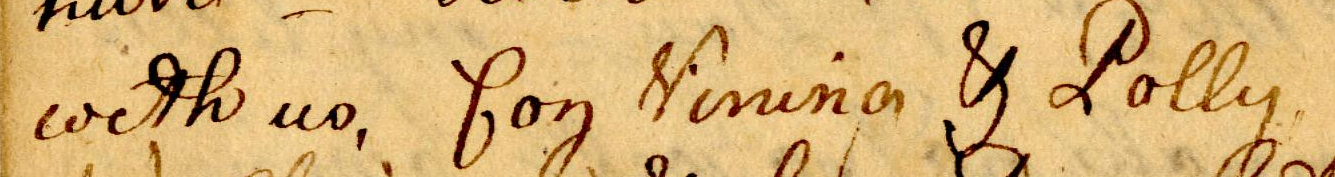with us, Coz Vining & Polly
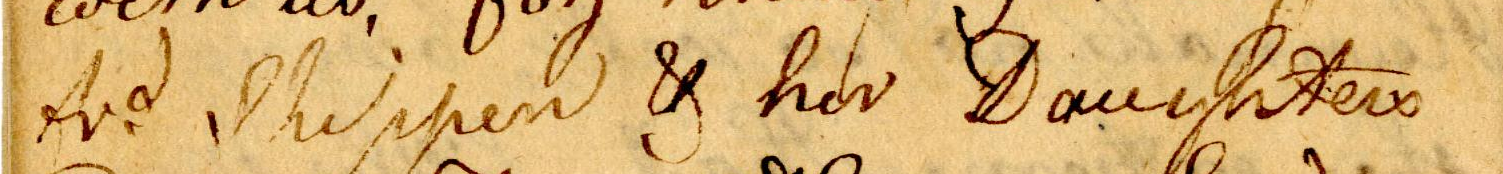fr^d. Shippen & her Daughters
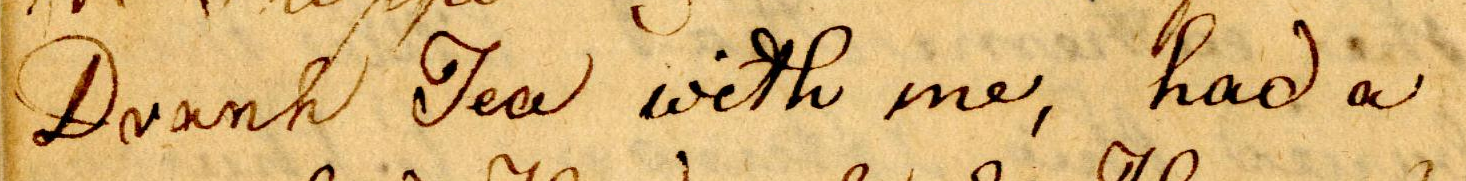Drank Tea with me, had a
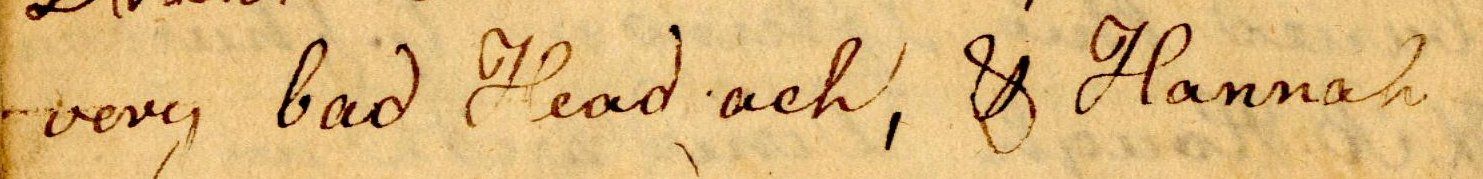very bad Head ach, & Hannah
